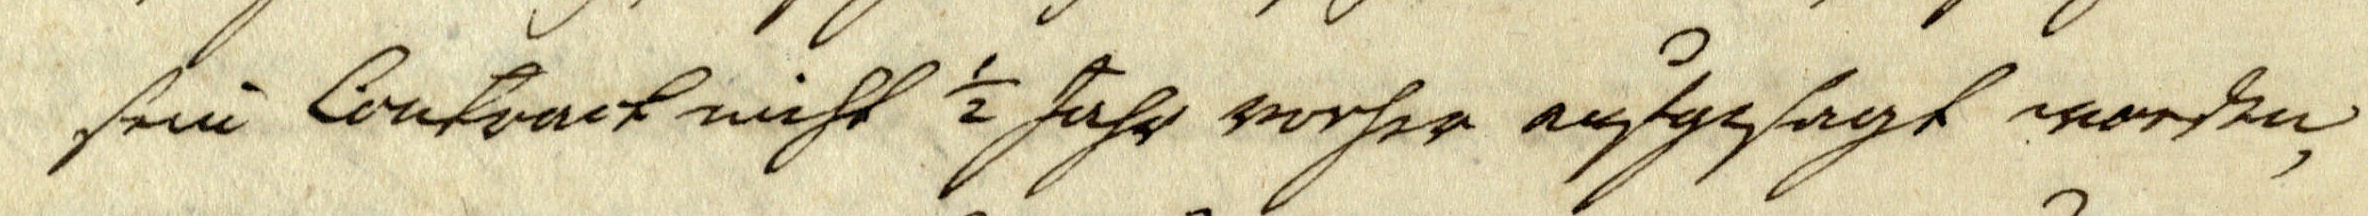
sein Contract nicht ½ Jahr vorher aufgesagt worden,
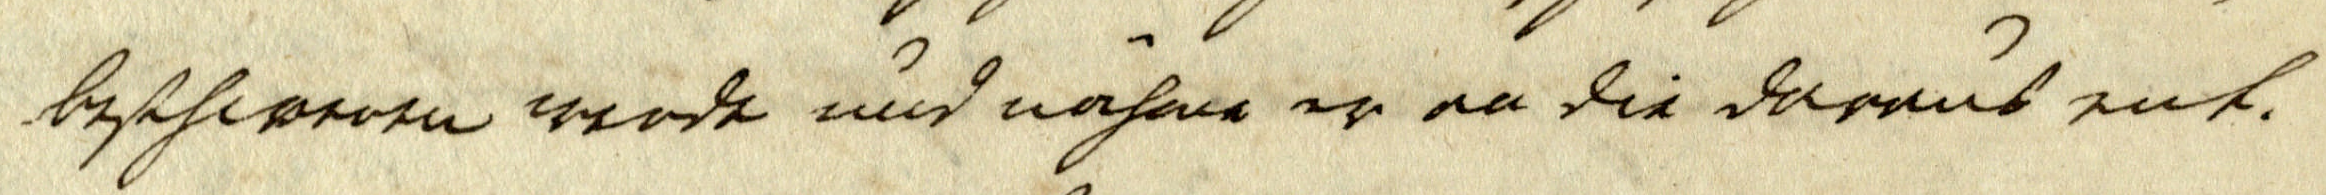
beschweren werde und nähme er an die daraus ent¬
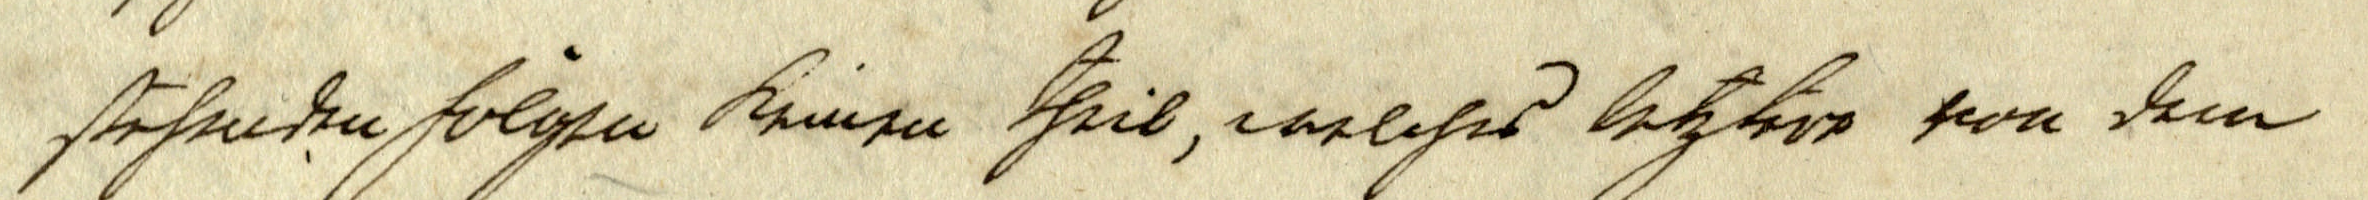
stehenden Folgen keinen Theil, welches letztere von dem
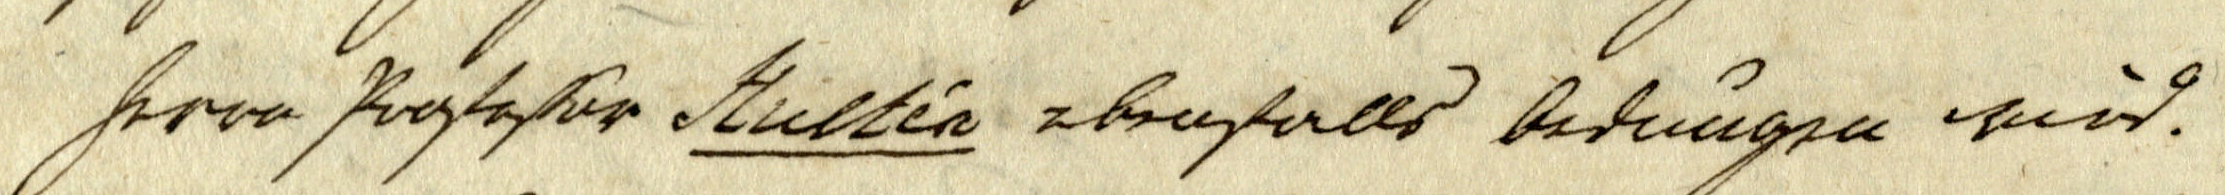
herrn Professor Hultèn ebenfalls bedungen wird.
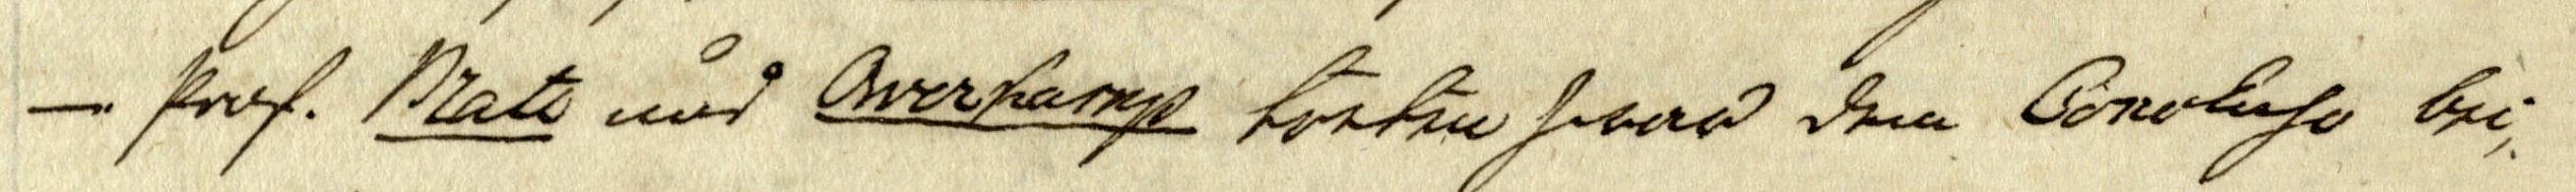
Prof. Bratt und Overkamp treten zwar dem Concluso bei,
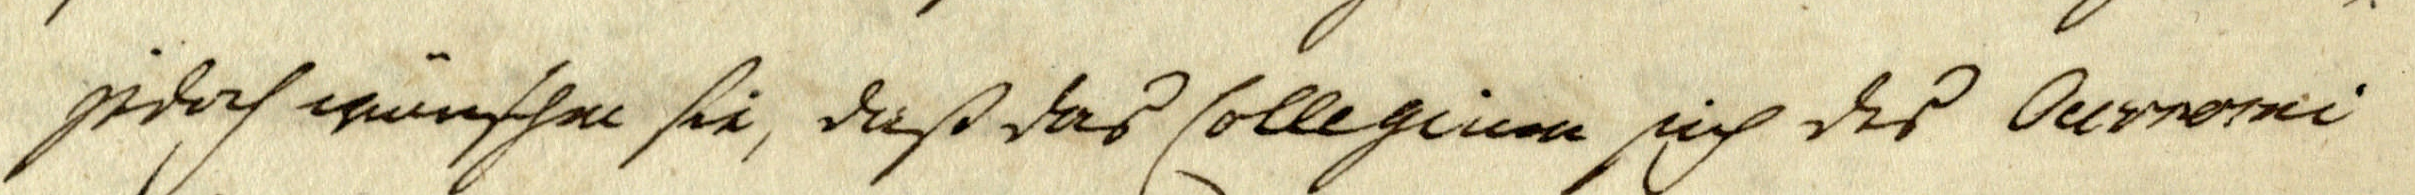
jedoch wünschen sie, daß das Collegium sich des Oeconomi
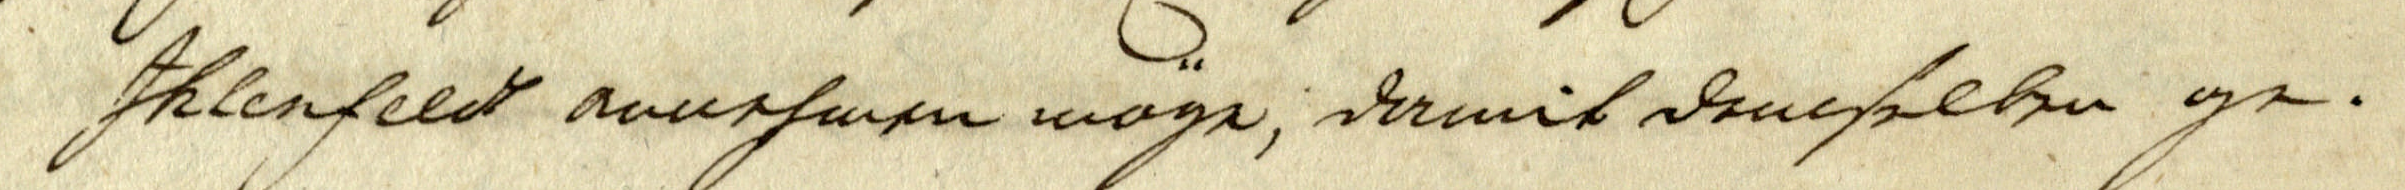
Ihlenfeldt annehmen möge, damit demselben ge¬
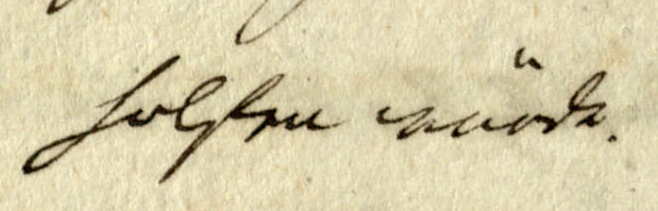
holfen würde.
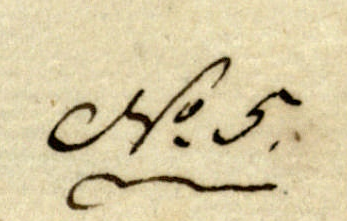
Nº 5.
